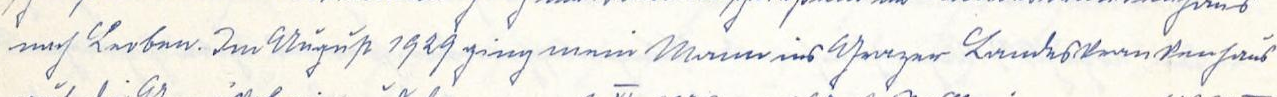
nach Leoben. Im August 1929 ging mein Mann ins Grazer Landeskrankenhaus
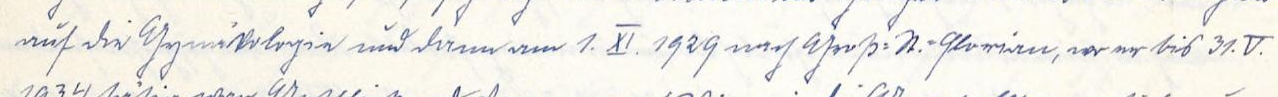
auf die Gynäkologie und dann am 1. XI. 1929 noch Groß- St. Florian, wo er bis 31. V.
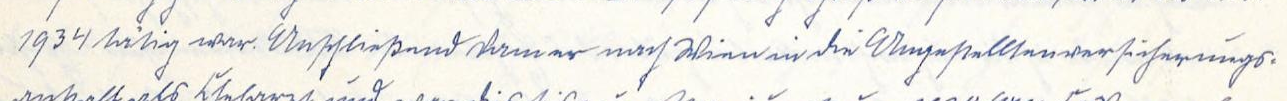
1934 tätig war. Anschließend kam er nach Wien in die Angestelltenversicherungs-
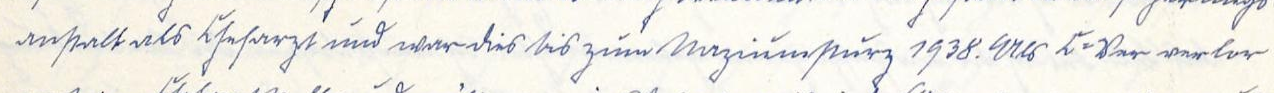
anstalt als Chefarzt und war dies bis zum Naziumsturz 1938. Als CVer verlor
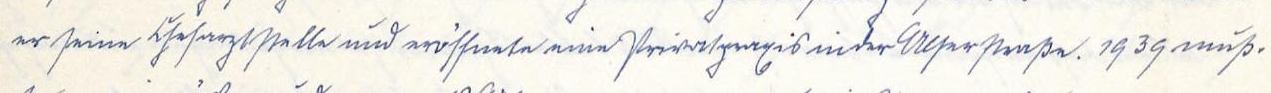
er seine Cefarztstelle und eröffnete eine Privatprais in der Alserstraße. 1939 muß-
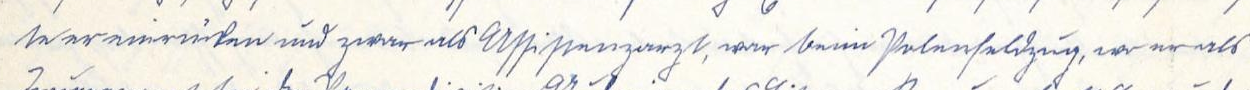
te er einrücken und zwar als Assistenzarzt, war beim Polenfeldzug, wo er als
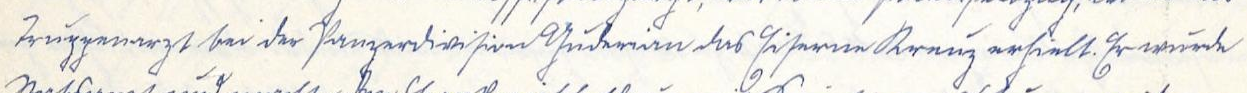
Truppenarzt bei der Panzerdivision Guderian das Eiserne Kreuz erhielt. Er wurde
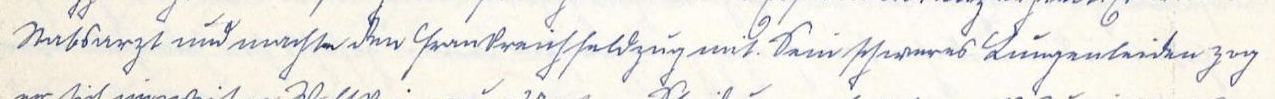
Stabsarzt und machte den Frankreichfeldzug mit . Sein schwerer Lungenleiden zog
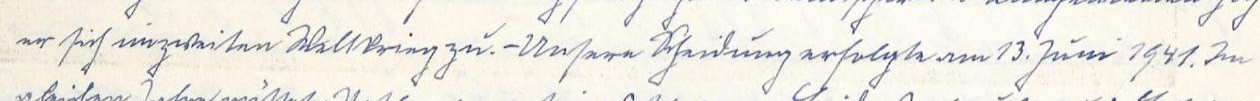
er sich im zweiten Weltkrieg zu. Unsere Scheindung erfolgte am 13. Juni 1941. Im
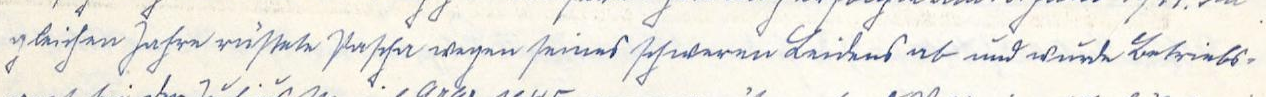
gleichen Jahre rüstete Pascha wegen seines schweren Leiden ab und wurde Betriebs-
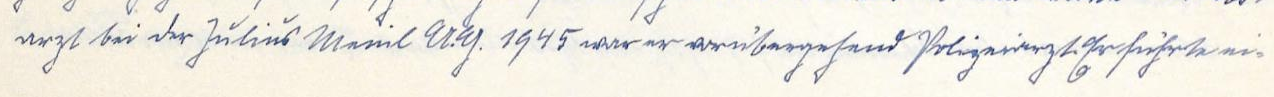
arzt bei der Julius Meinl AG, 1945 war er vorübergehend Polizeiarzt. Er führte ei-
